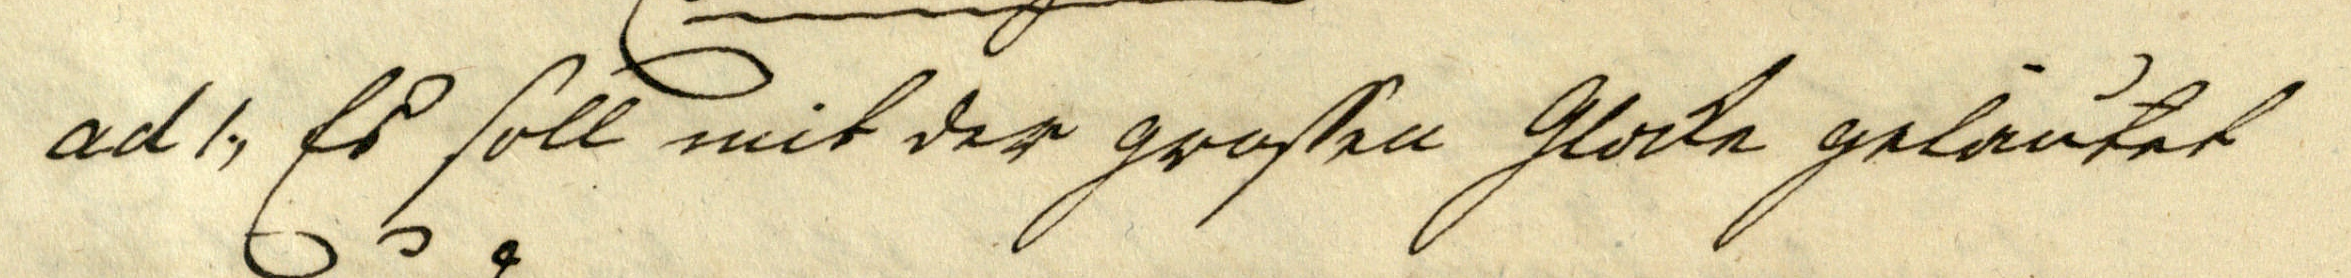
ad 1., Es soll mit der grossen Glocke geläutet
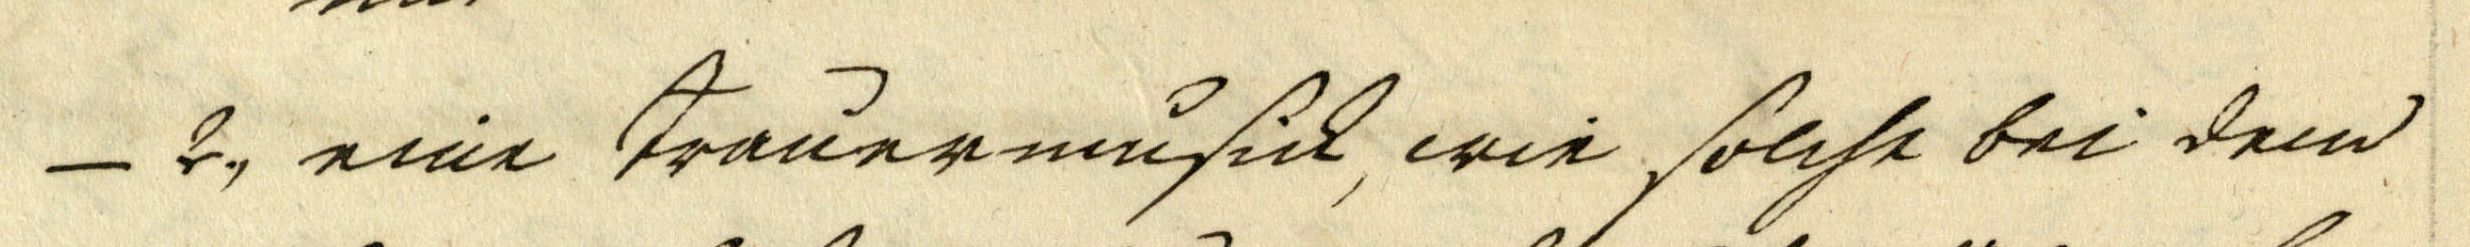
2., eine Trauermusick, wie solche bei dem
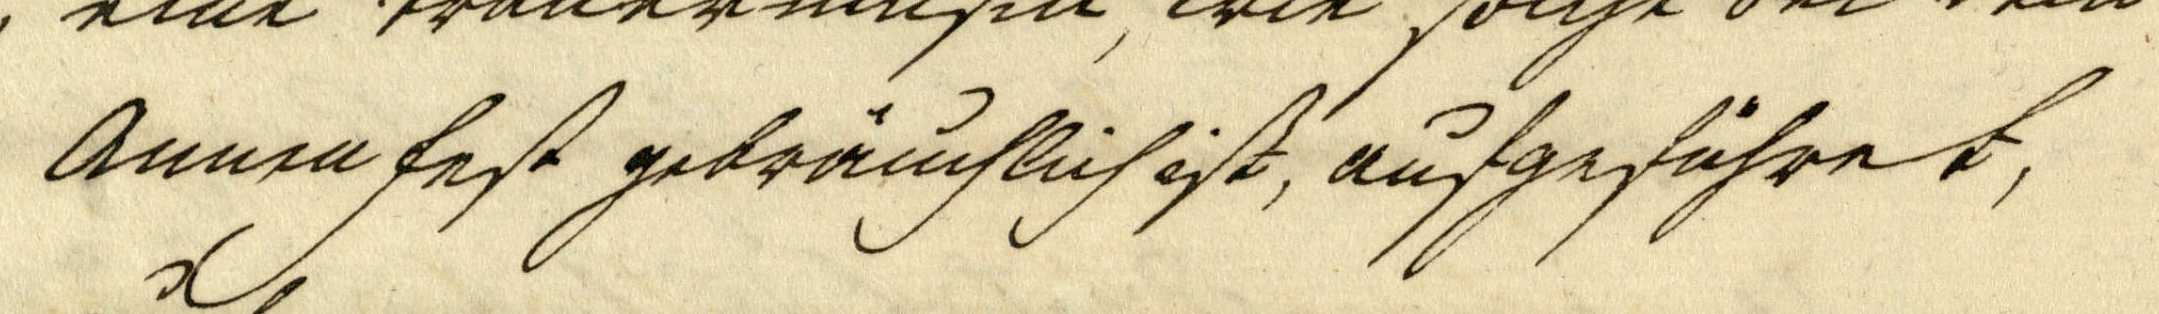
Annen Fest gebräuchlich ist, aufgeführet,
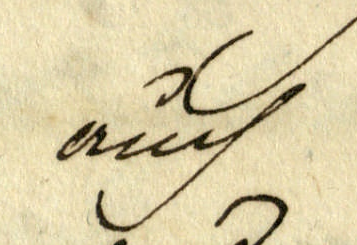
auch
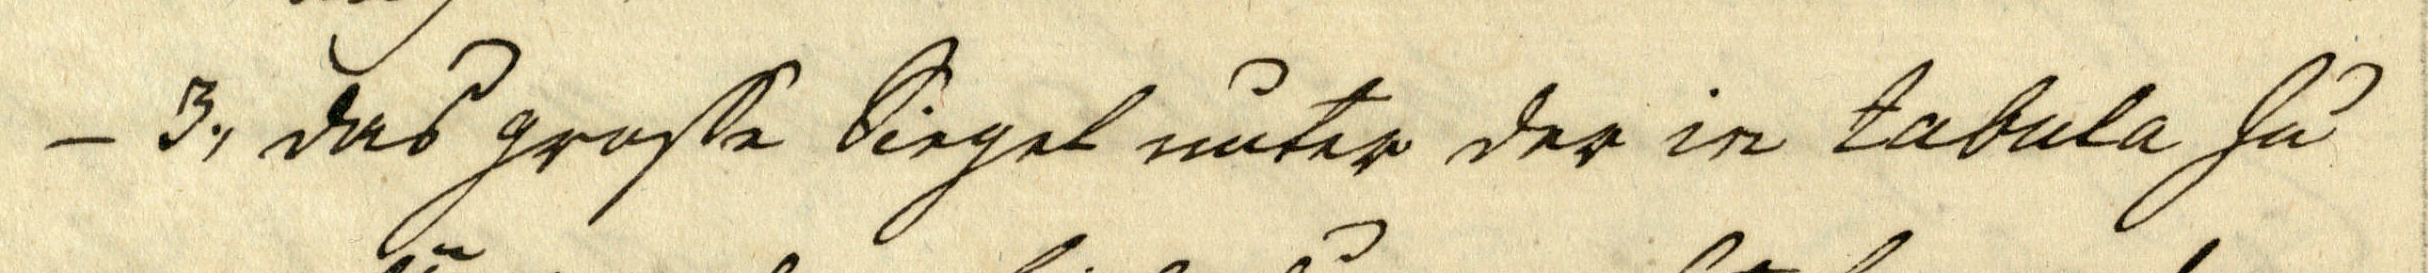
3., das grosse Siegel unter der in tabula zu
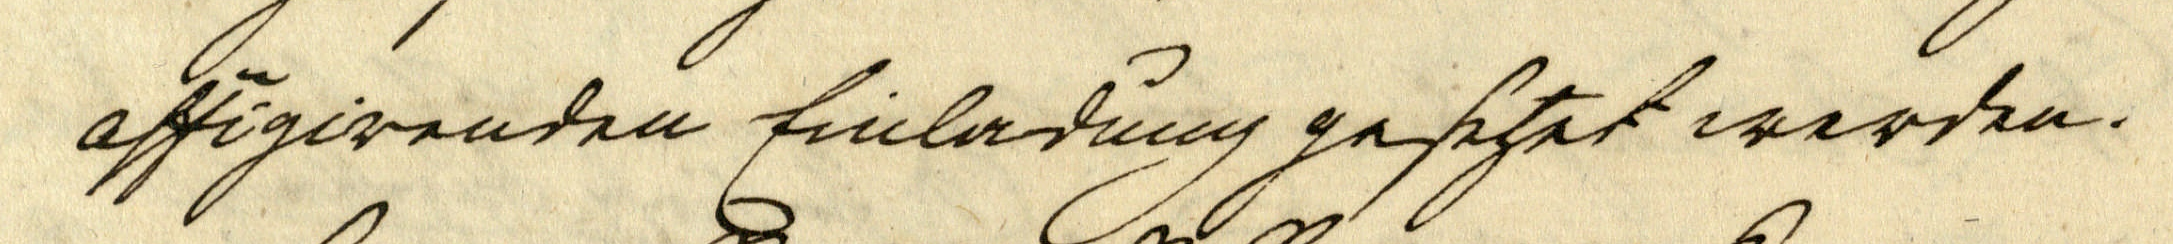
affigirenden Einladung gesetzet werden.
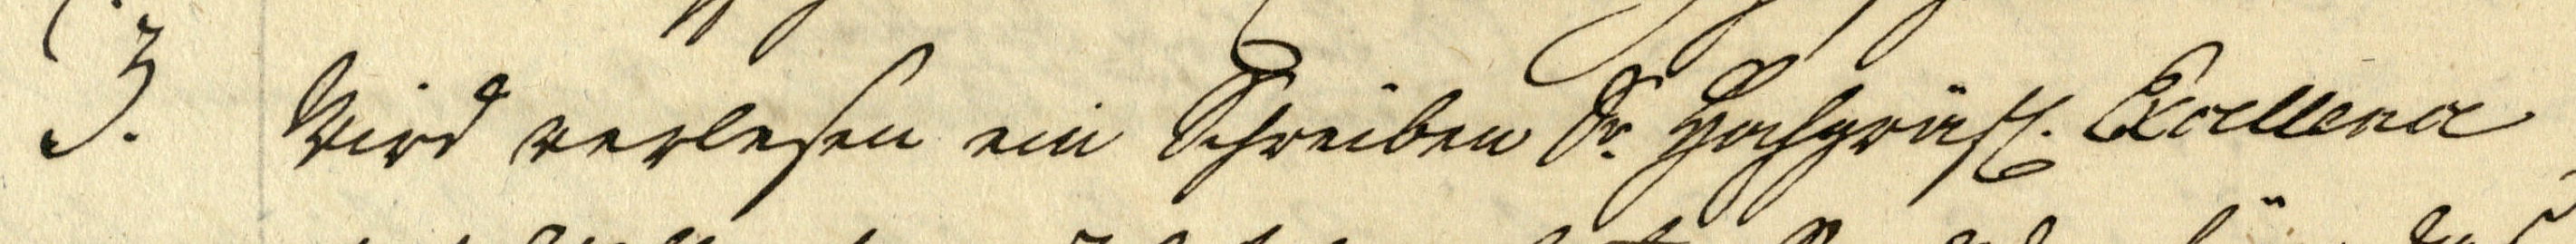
3. Wird verlesen ein Schreiben Sr Hochgräfl. Excellence
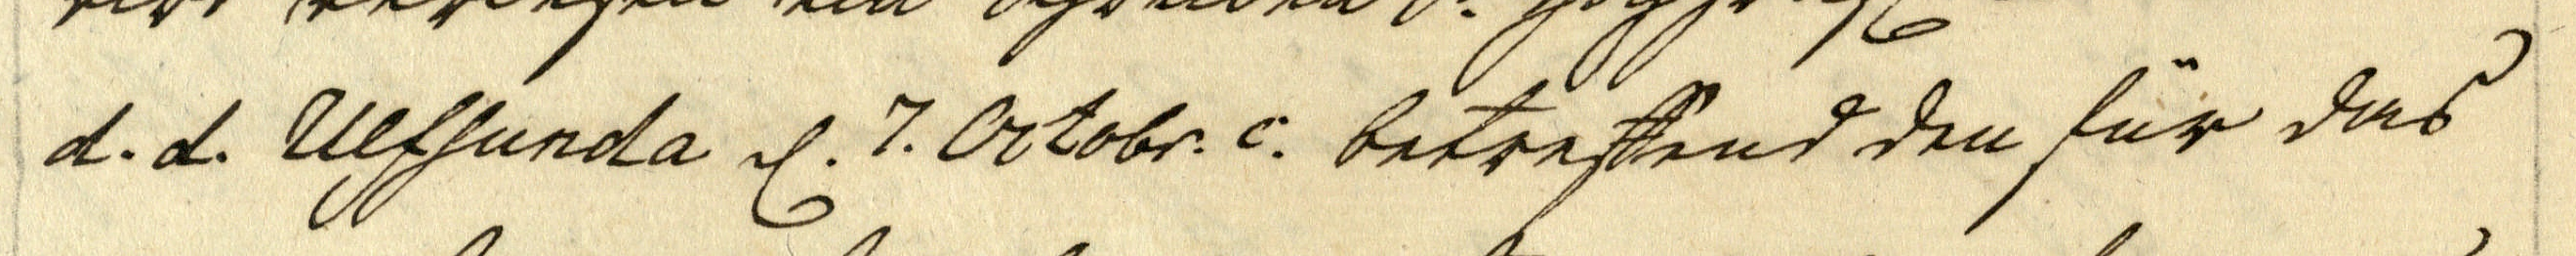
d. d. Ulfsunda d. 7. Octobr. c. betreffend den für das
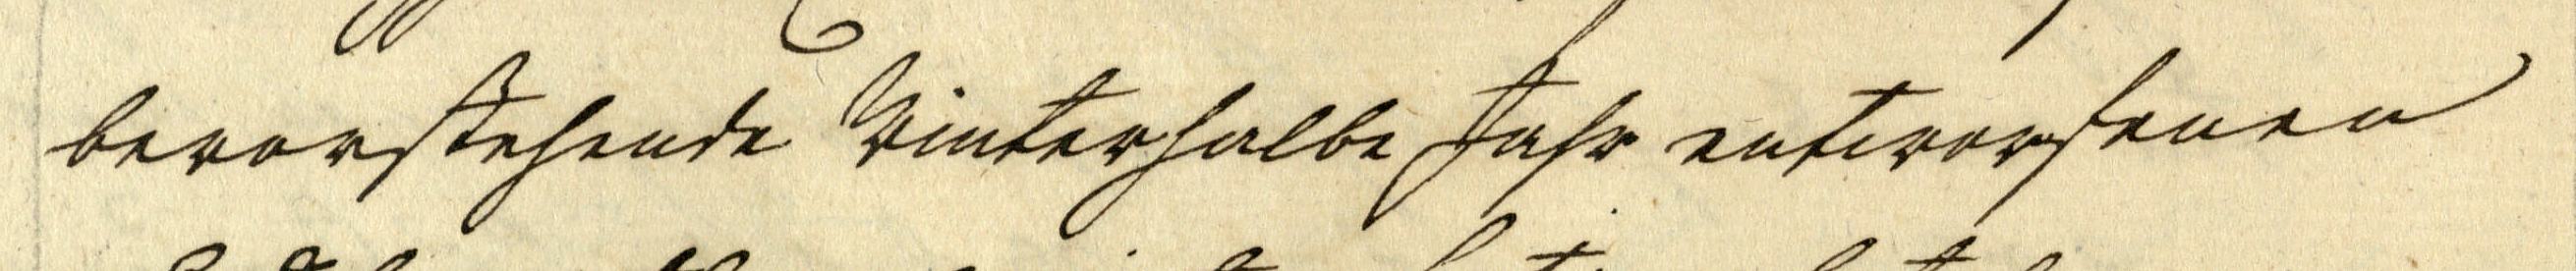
bevorstehende Winterhalbe Jahr entworfenen
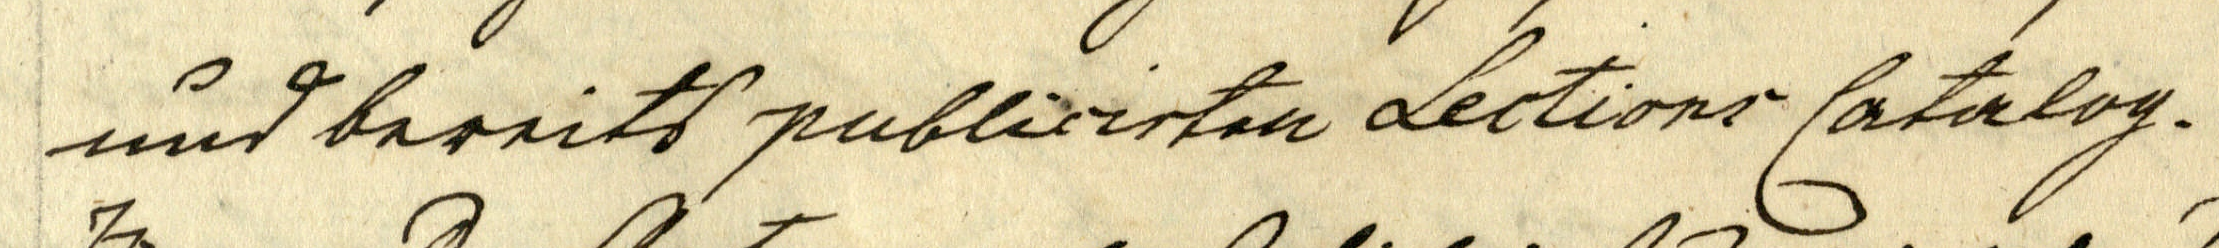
und bereits publicirten Lections Catalog.
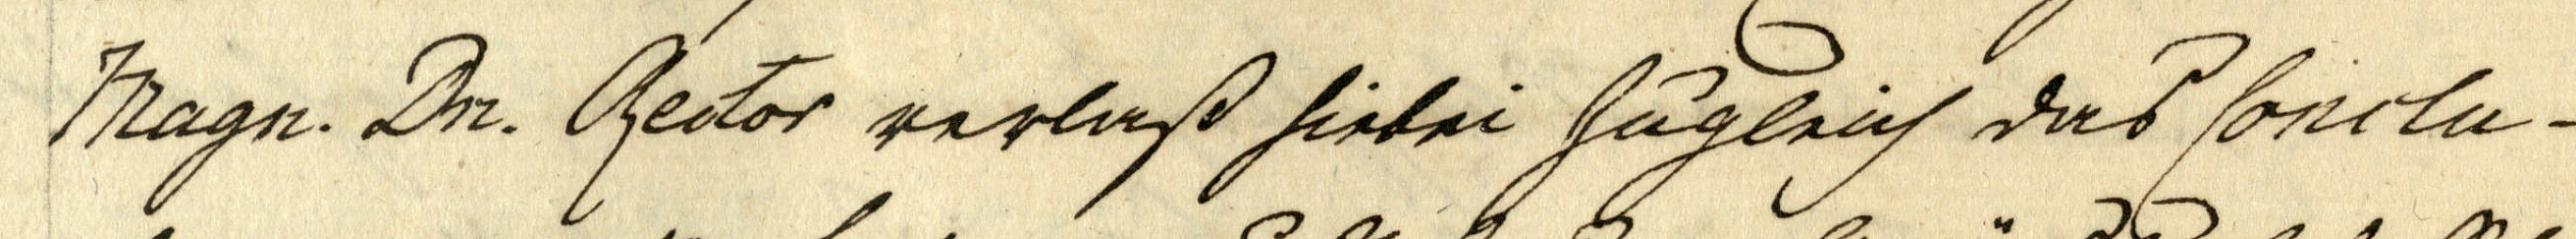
Magn. Dn. Rector verlaß hiebei zugleich das Conclu¬
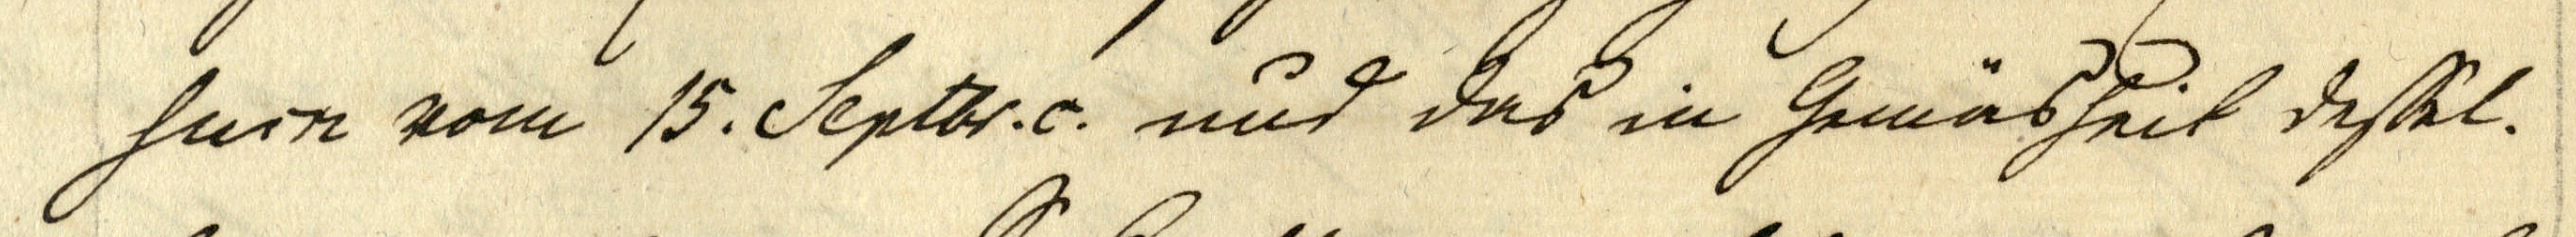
sum vom 15. Septbr. c. und das in Gemäsheit dessel¬
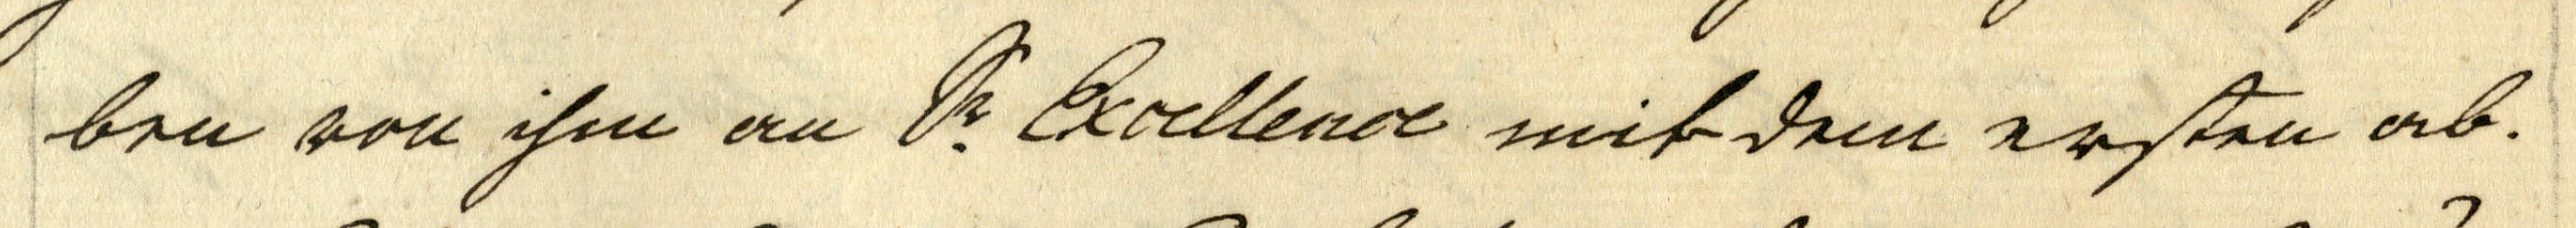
ben von ihm an Sr Excellence mit dem ersten ab¬
